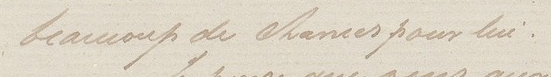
beaucoup de chances pour lui.
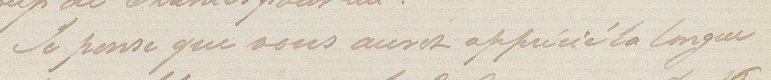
Je pense que vous aurez apprécié la longue
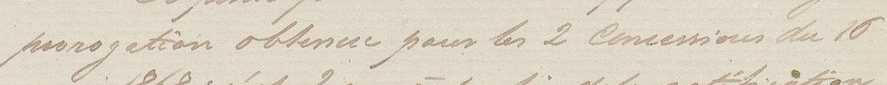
prorogation obtenue pour les 2 Concessions du 10
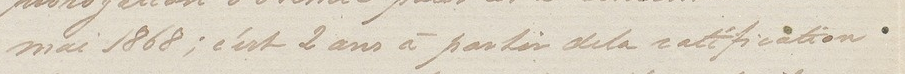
mai 1868; c'est 2 ans à partir de la ratification
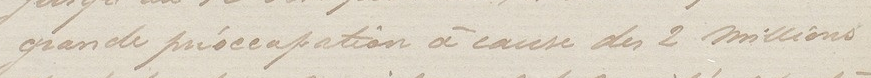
grande préoccupation à cause des 2 millions
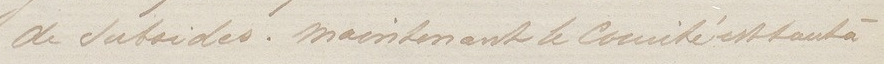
de subsides. Maintenant le Comité est tout
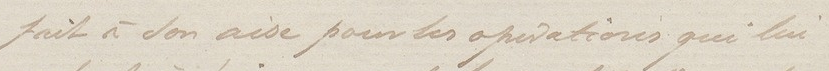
fait à son aise pour les opérations qui lui
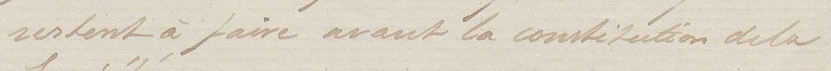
restent à faire avant la constitution dela
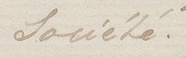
Société.
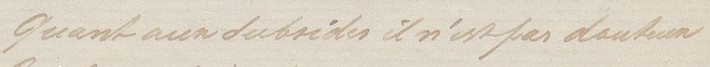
Quant aux subsides il n'est pas douteux
